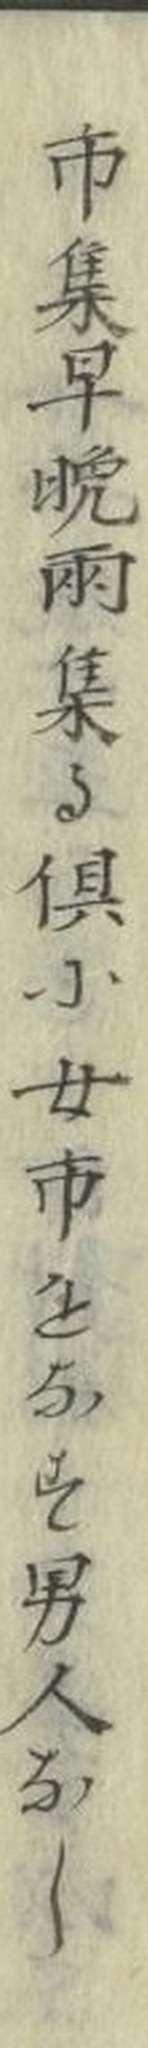市集早晚雨集る俱に女市をなす男人なし
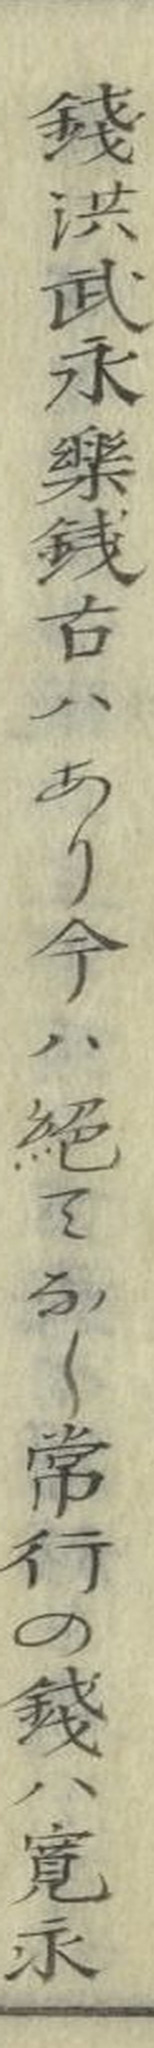銭洪武永楽銭古はあり今は絶てなし常行の銭は寛永
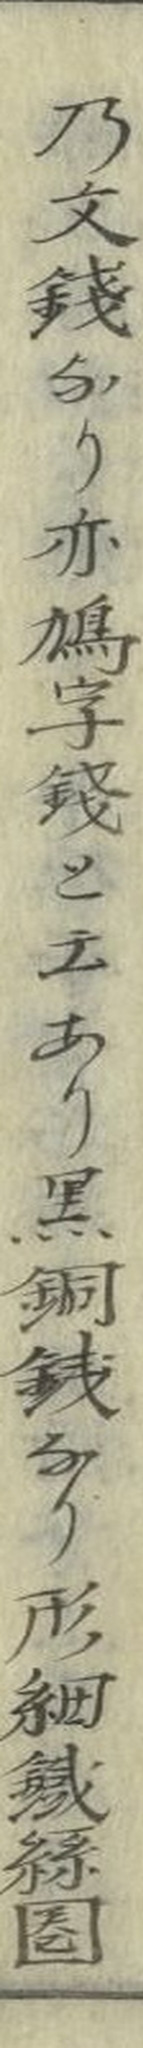の文銭なり亦鳩字銭と云あり黒銅銭なり形細鉄糸圈
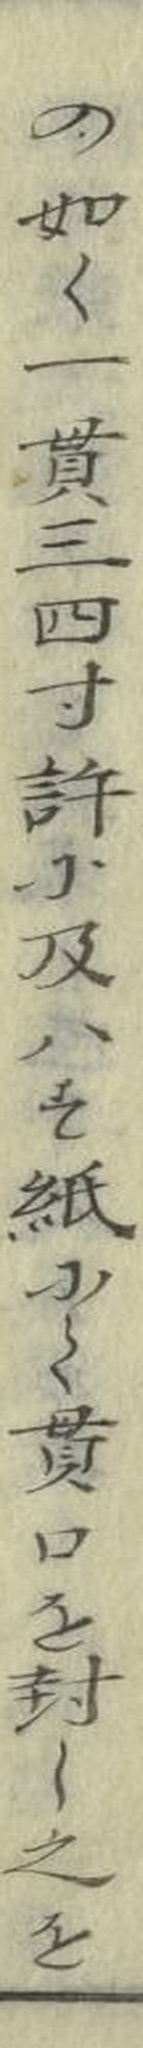の如く一貫三四寸許に及はす紙にて貫口を封し之を

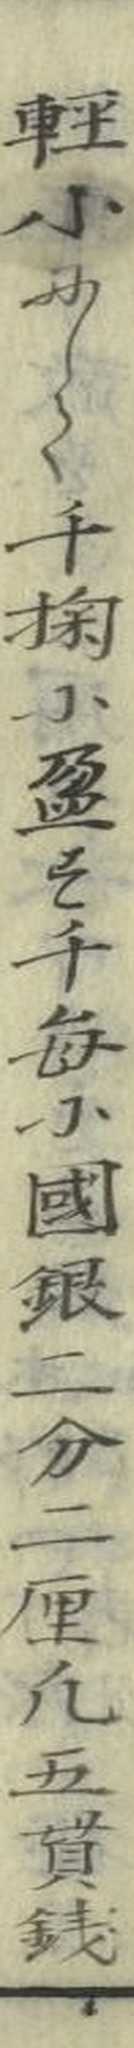軽小にして千掬に盈す千毎に国銀二分二厘凡五貫銭
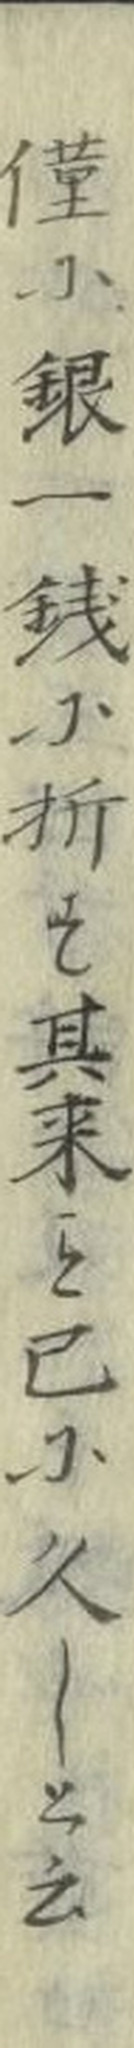僅に銀一銭に折す其来こと已に久しと云
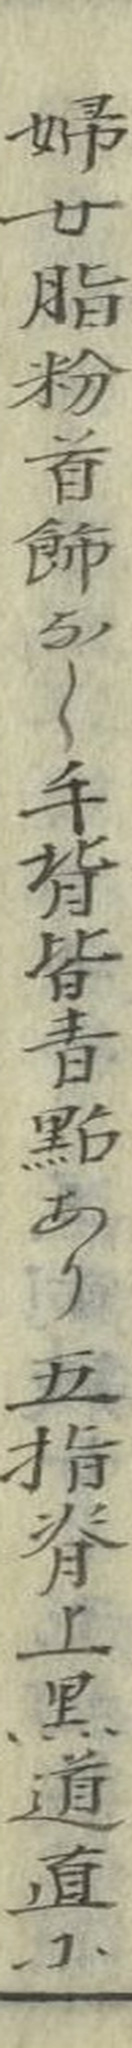婦女脂粉首飾なし手背皆青点あり五指脊上黒道直に
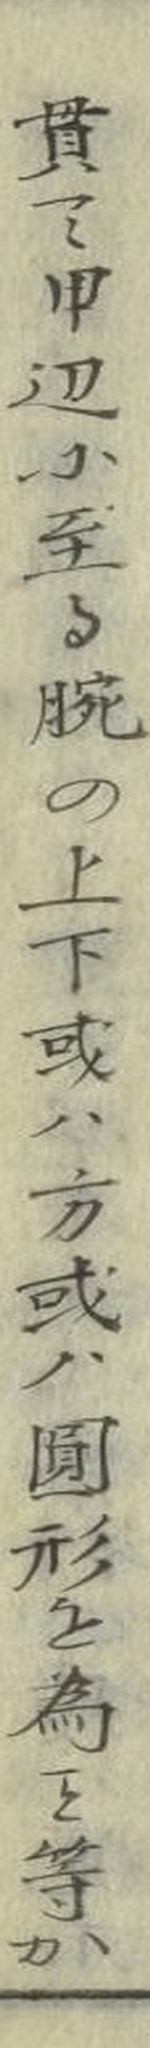貫て甲辺に至る腕の上下或は方或は円形を為こと等か
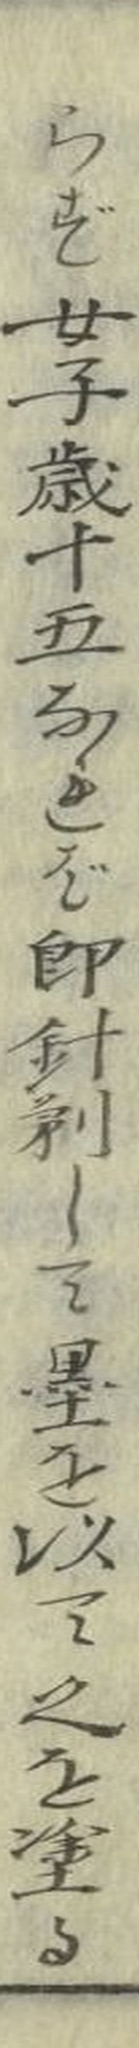らず女子歳十五なれば即針剃して墨を以て之を塗る
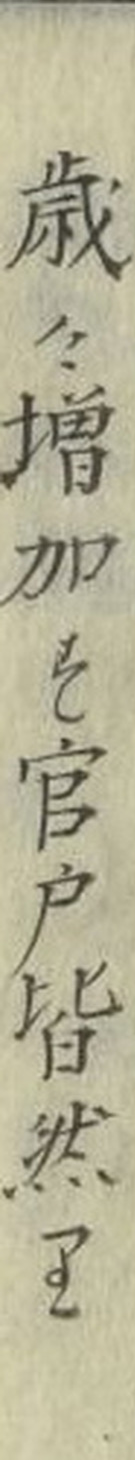歳々増加す官戸皆然り
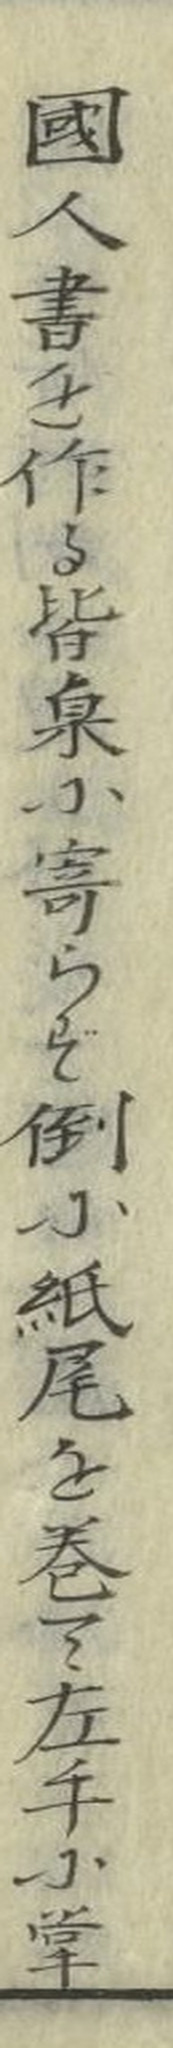国人書を作る皆臬に寄らず倒に紙尾を巻て左手に掌
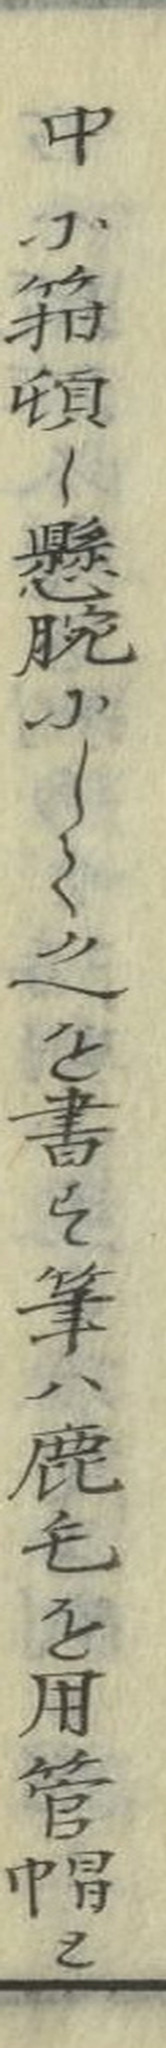中に箝頓し懸腕にして之を書す筆は鹿毛を用管帽と
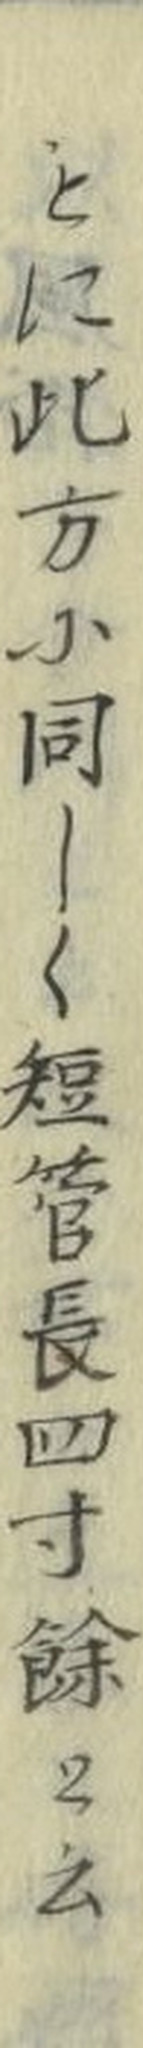もに此方に同しく短管長四寸餘と云
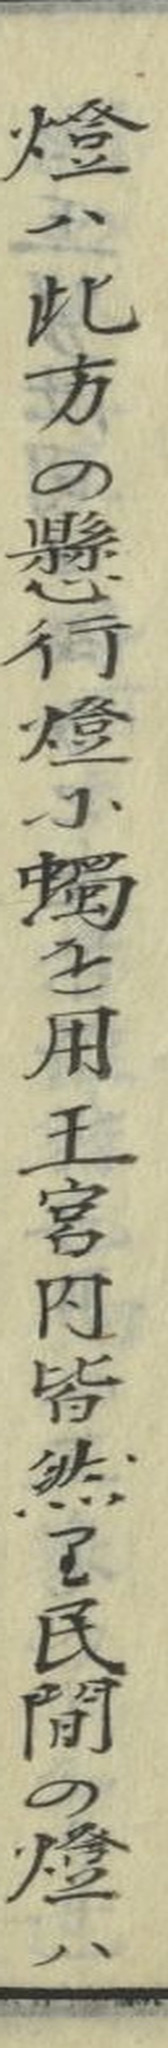燈は此方の懸行燈に燭を用王宮内皆然り民間の燈は
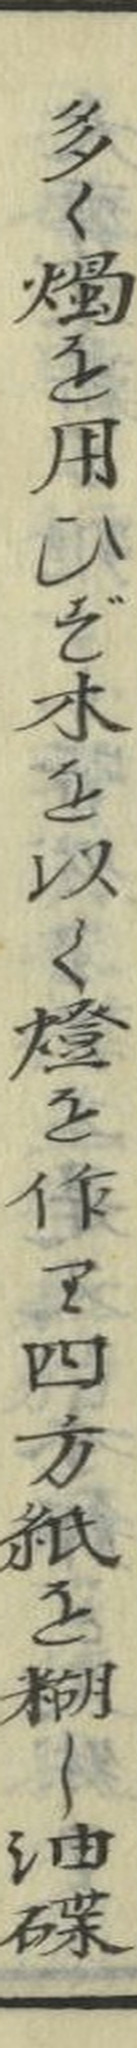多く燭を用ひず木を以て燈を作り四方紙を糊し油碟
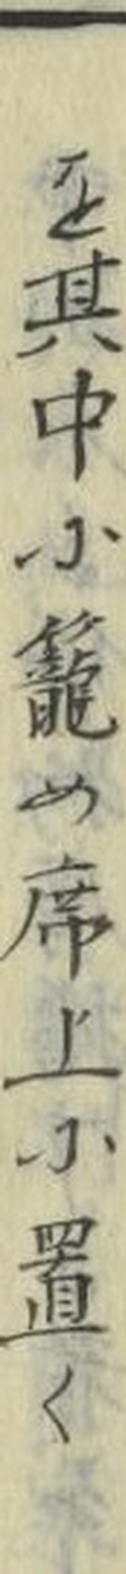を其中に籠め席上に置く
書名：琉球沿革志 上
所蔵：University of the Ryukyus Library
